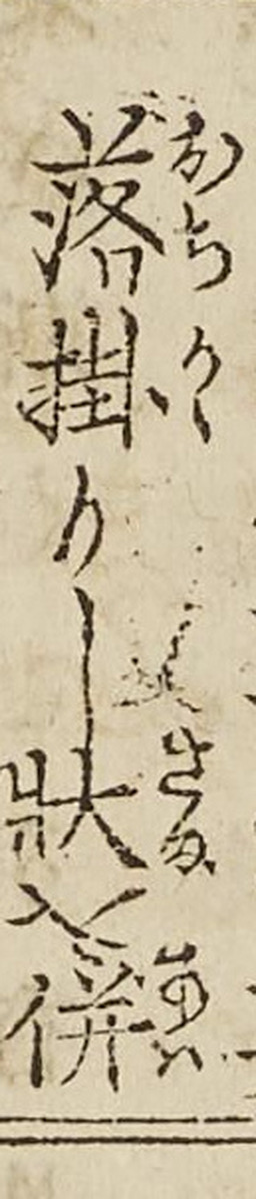落掛りし状を併
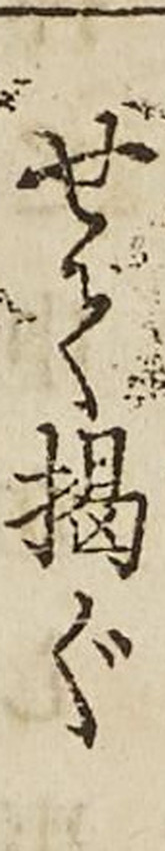せて掲ぐ
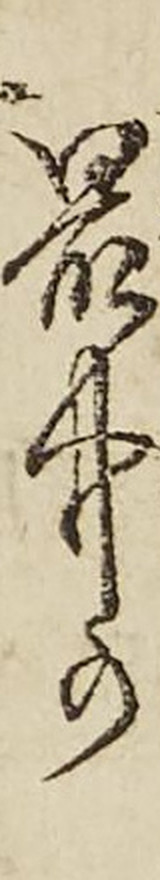最中の
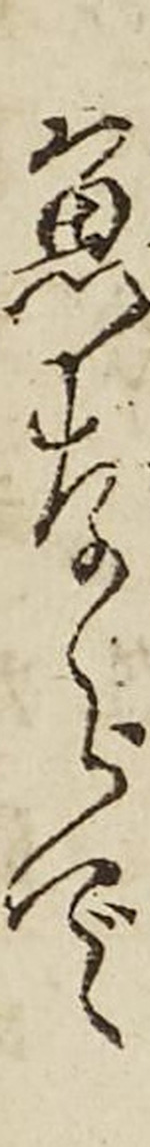魚ならで
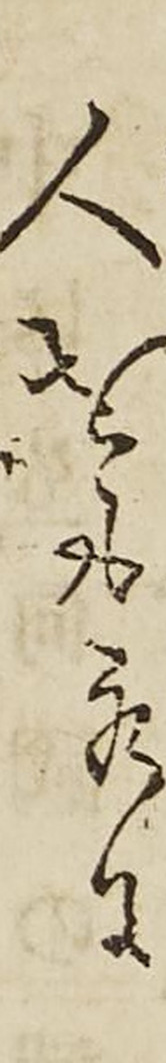人をも水に
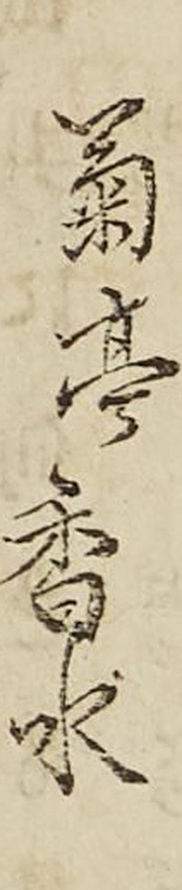菊亭香水

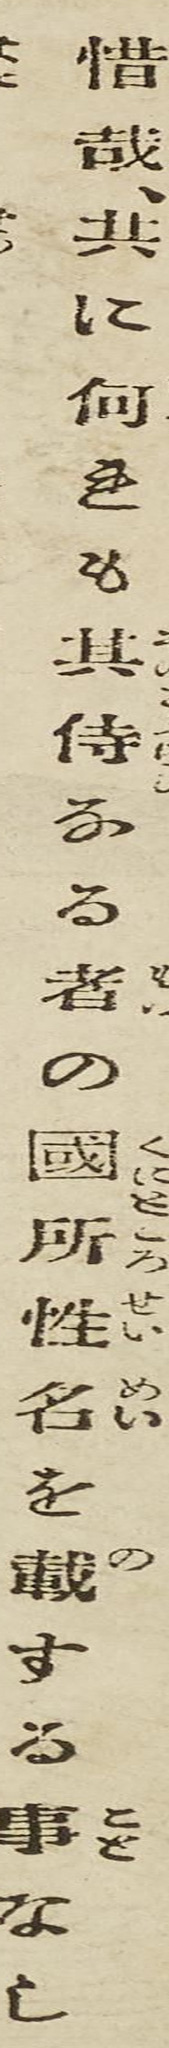惜哉、共に何れも其侍なる者の国所姓名を載する事なし
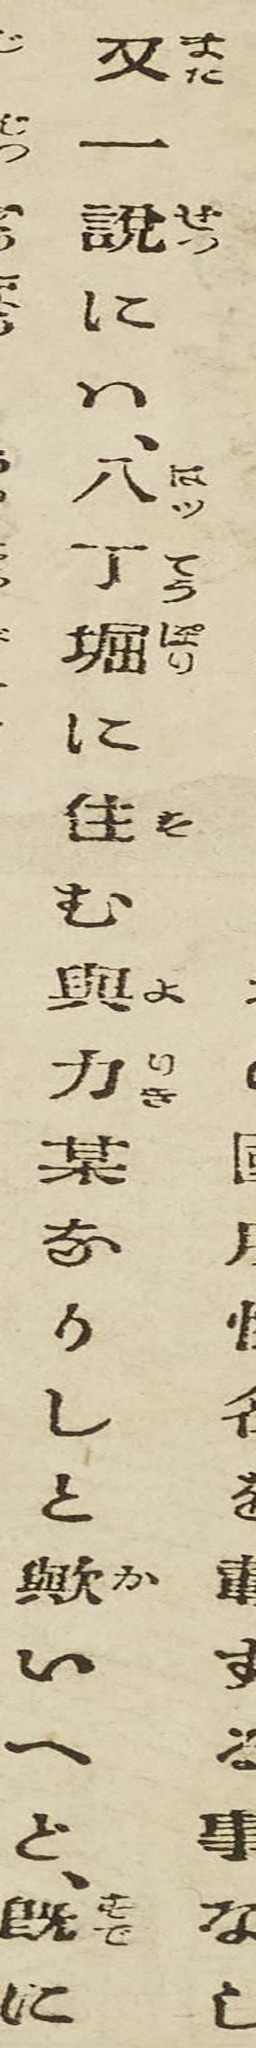又一説には、八丁堀に住む与力某なりしと歟いへと、既に
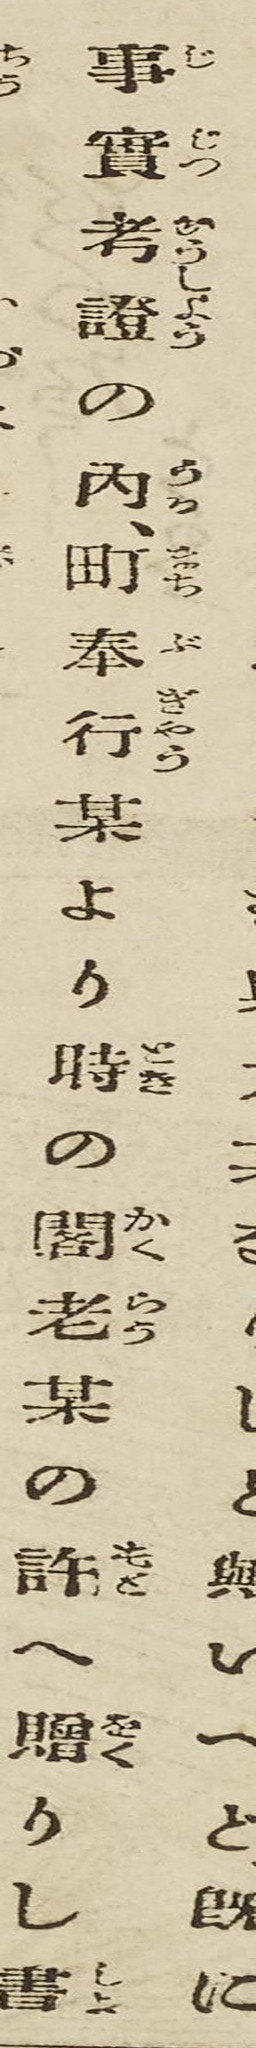事実考証の内、町奉行某より時の閣老某の許へ贈りし書
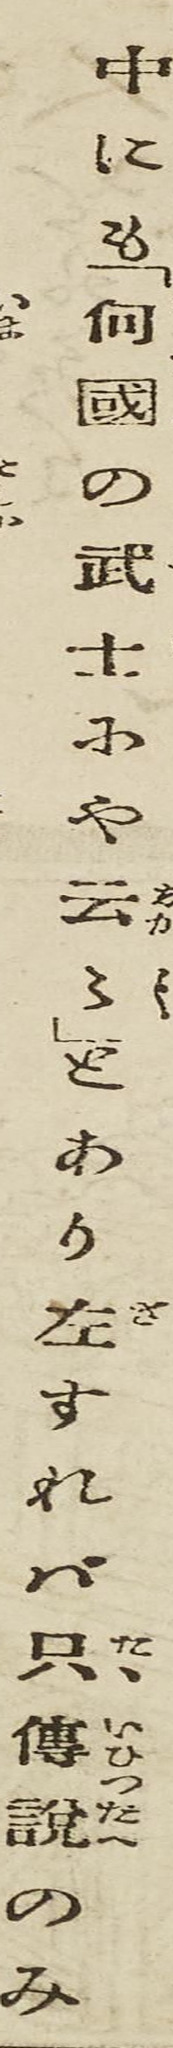中にも「何国の武士にや云〻」とあり左すれば只伝説のみ
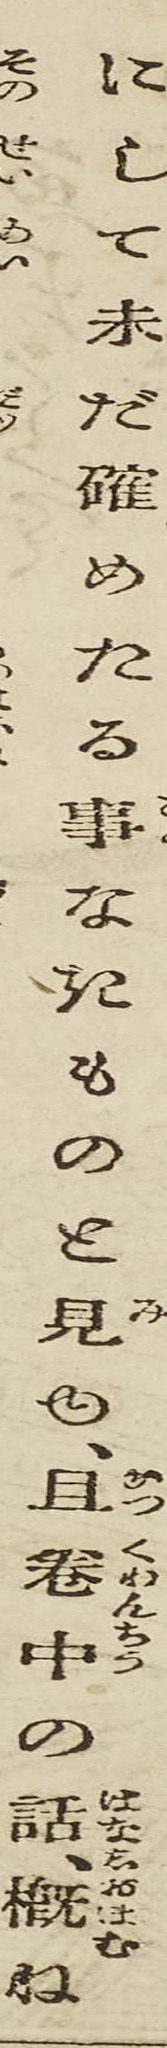にして未だ確めたる事なきものと見ゆ、且巻中の話、概ね
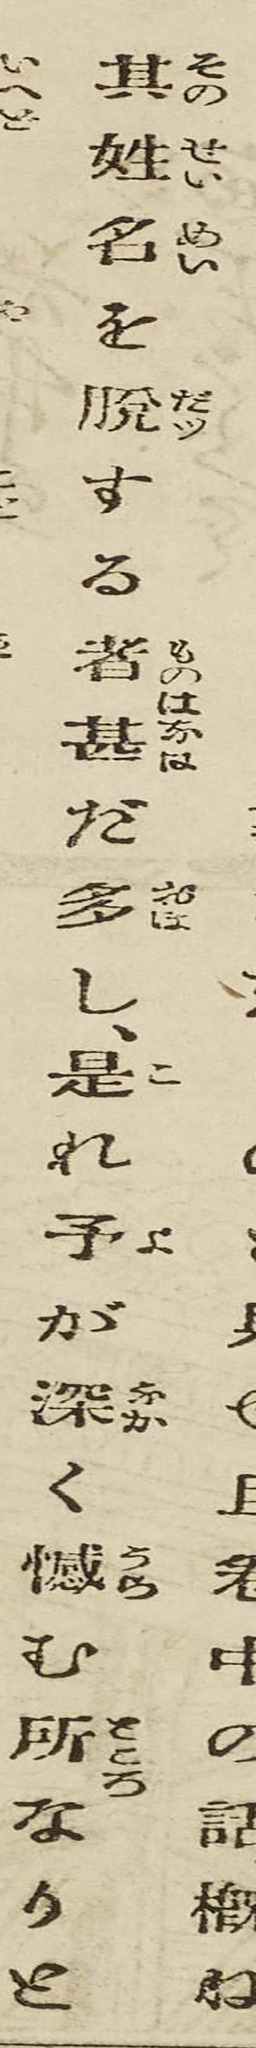其姓名を脱する者甚だ多し、是れ予が深く憾む所なりと
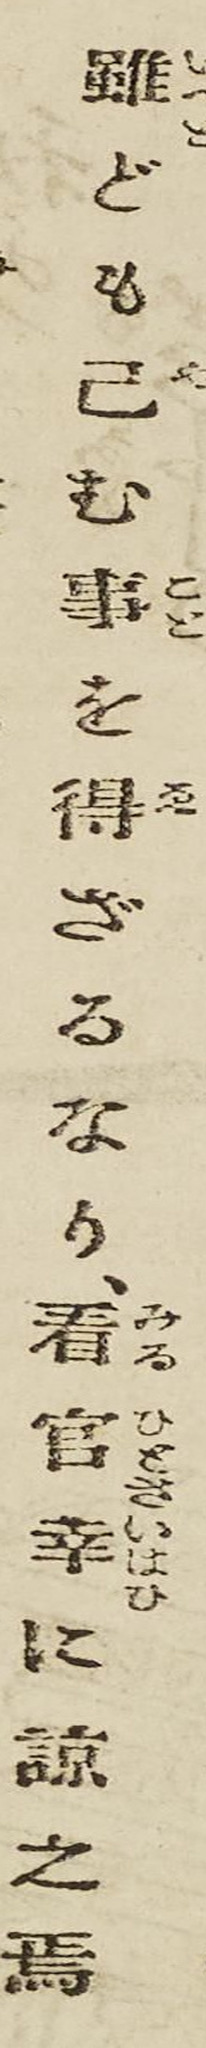雖も已む事を得ざるなり、看官幸に諒之焉
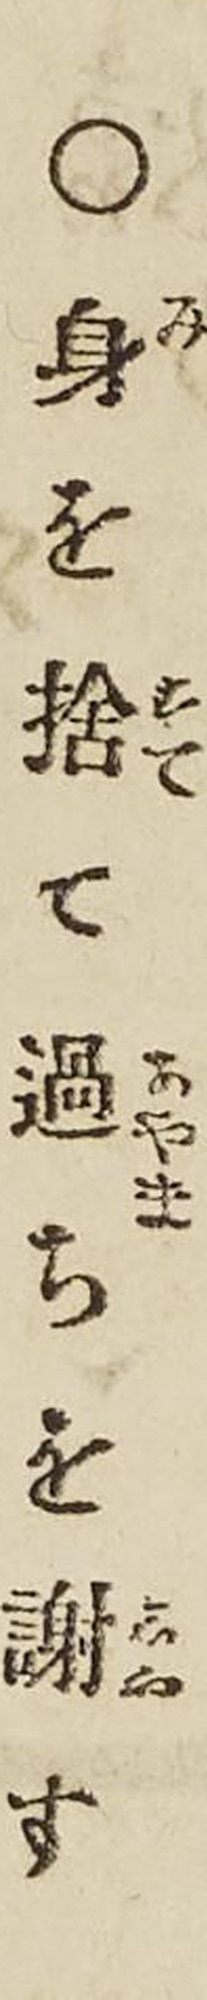○身を捨て過ちを謝す
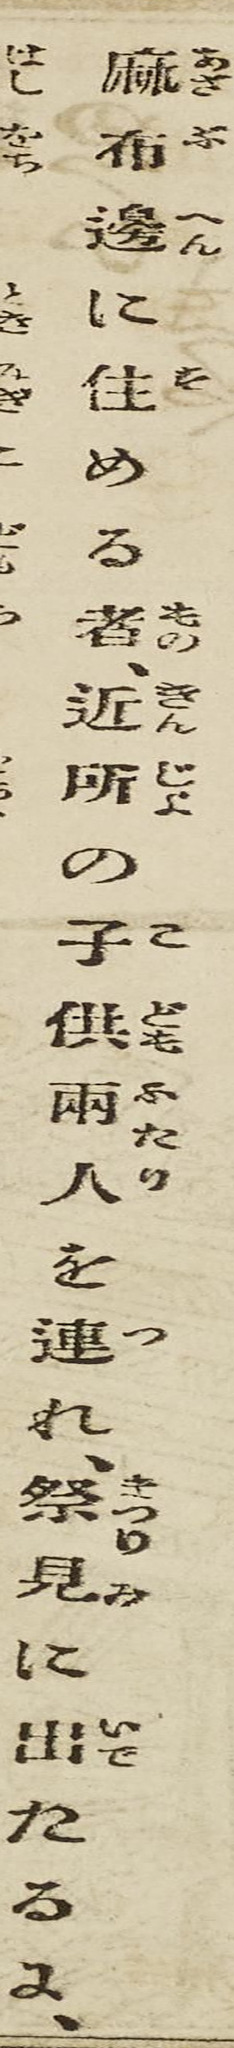麻布辺に住める者、近所の子供両人を連れ、祭見に出たるに、
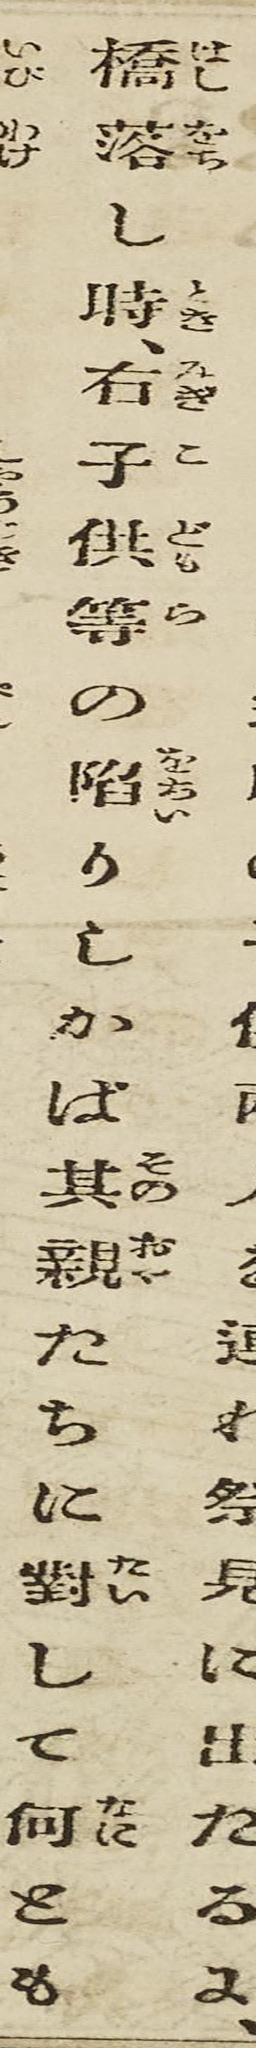橋落し時、右子供等の陥りしかば其親たちに対して何とも
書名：永代惨話　文化の夢　全
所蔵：東京大学地震研究所図書室 Earthquake Research Institute Library, The University of Tokyo, JAPAN
